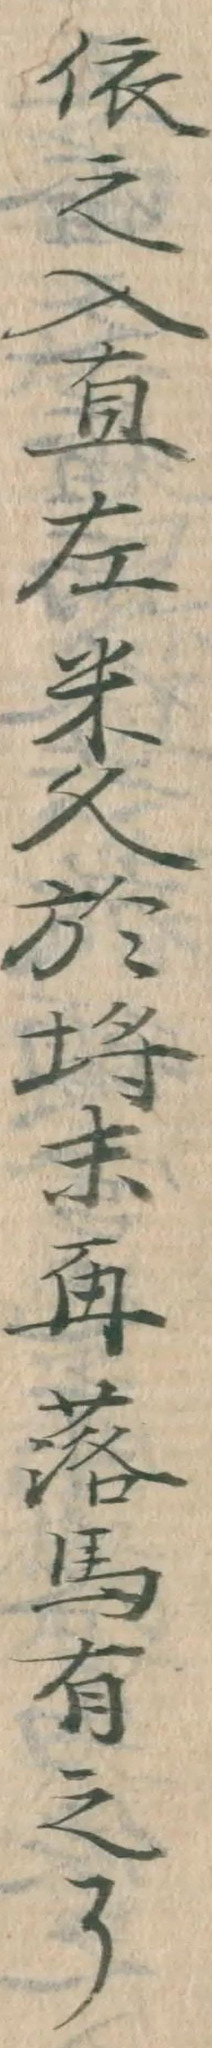依之入直左米久於埒末再落馬有之了
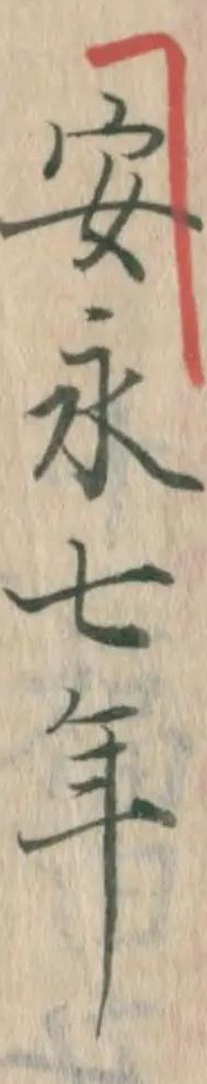安永七年
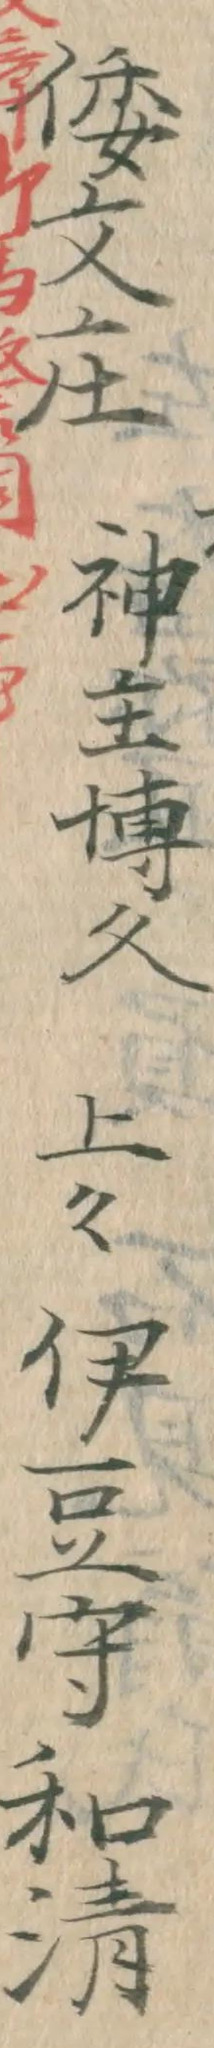倭文庄神主博久上々伊豆守和清
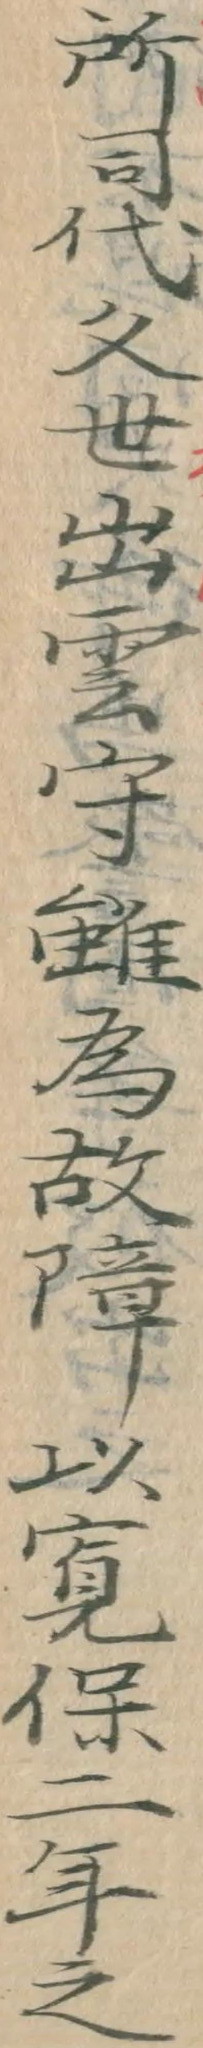所司代久世出雲守雖為故障以寛保二年之

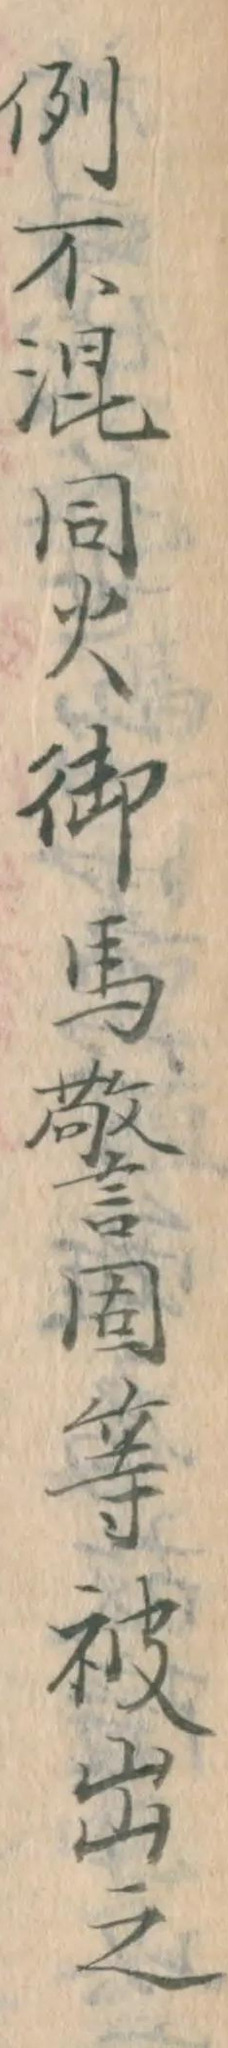例不混同火御馬警固等被出之
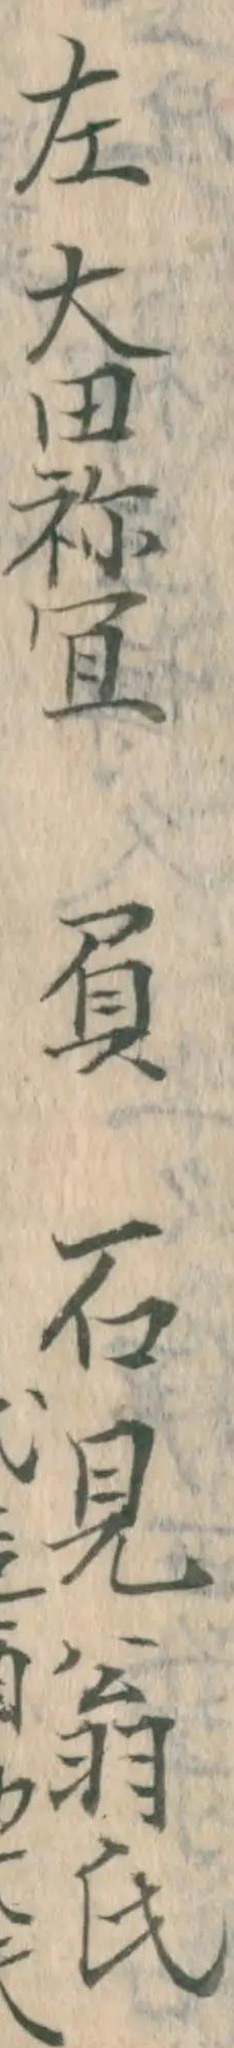左大田祢宜負石見翁氏
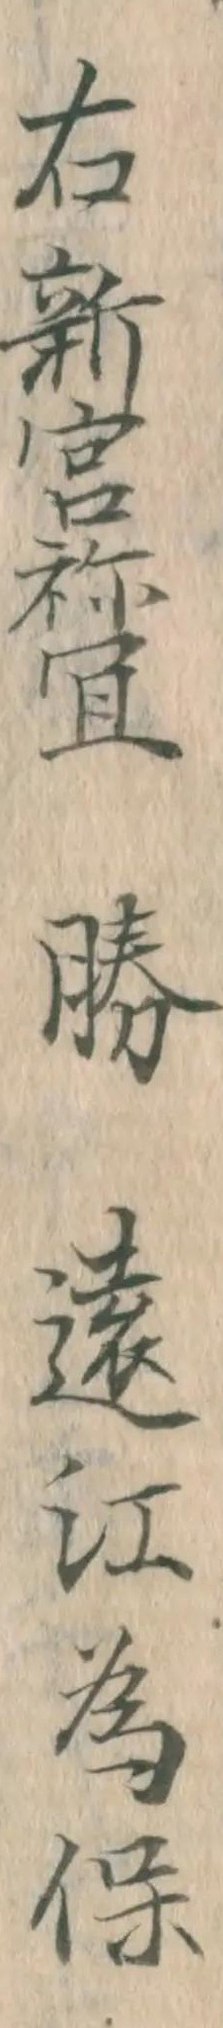右新宮祢宜勝遠江為保
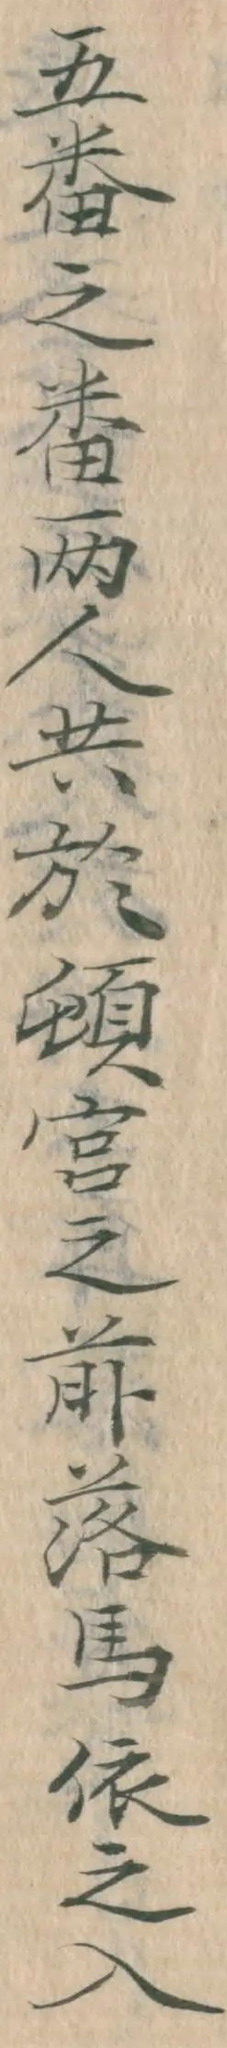五番之番両人共於頓宮之前落馬依之入
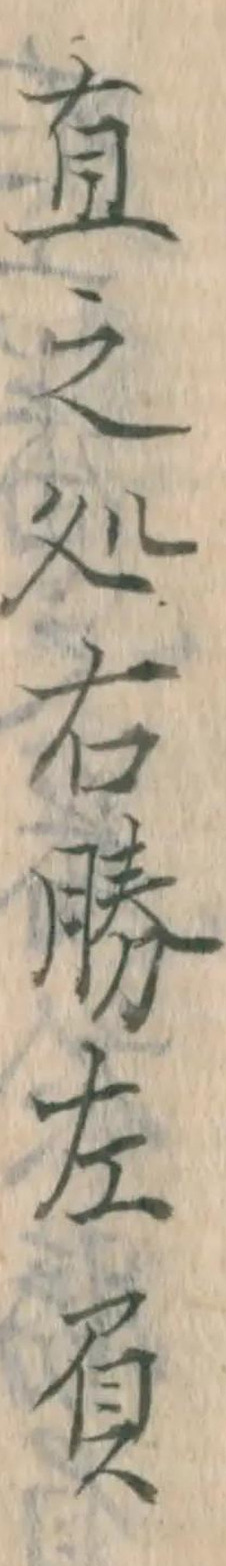直之処右勝左負
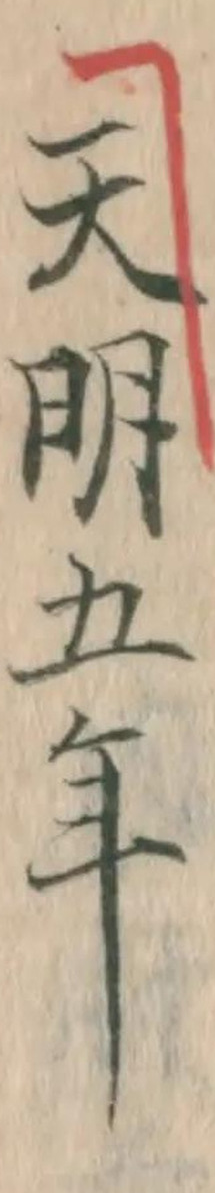天明五年
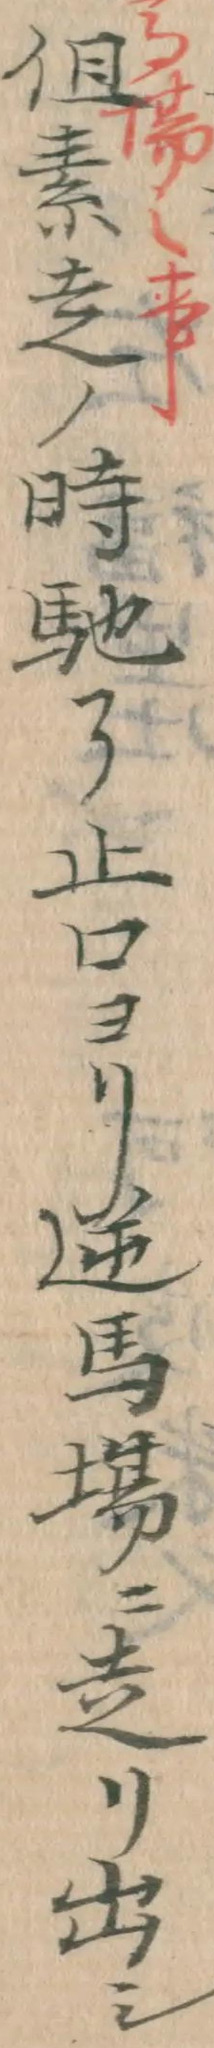但素走ノ時馳了止口ヨリ逆馬場ニ走リ出シ
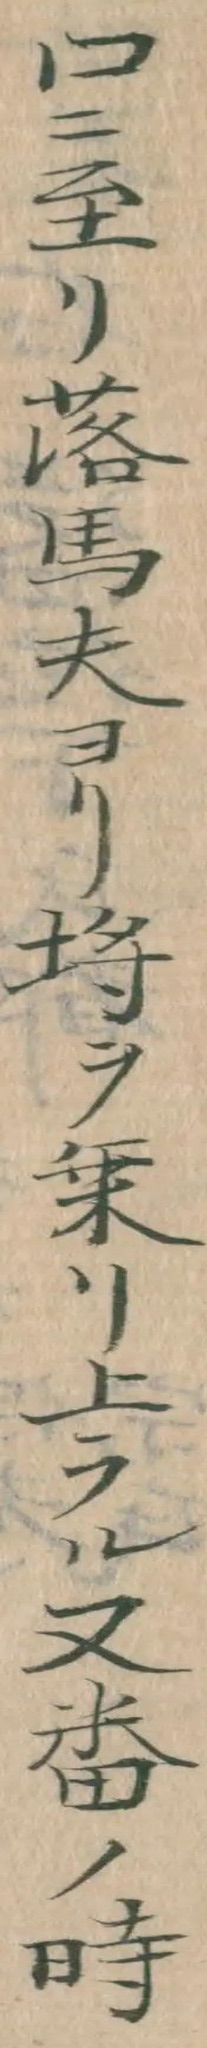口ニ至リ落馬夫ヨリ埒ヲ乗リ上ラル又番ノ時
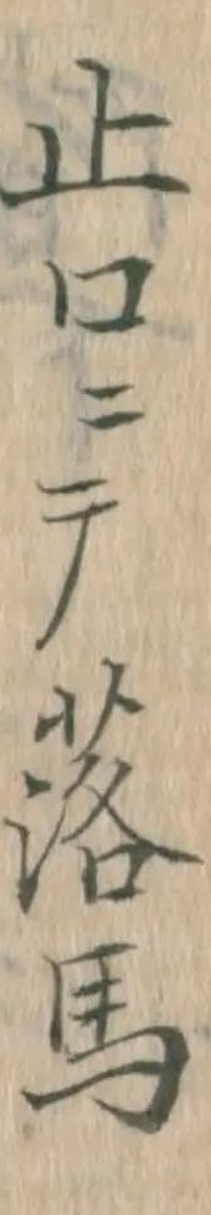止口ニテ落馬
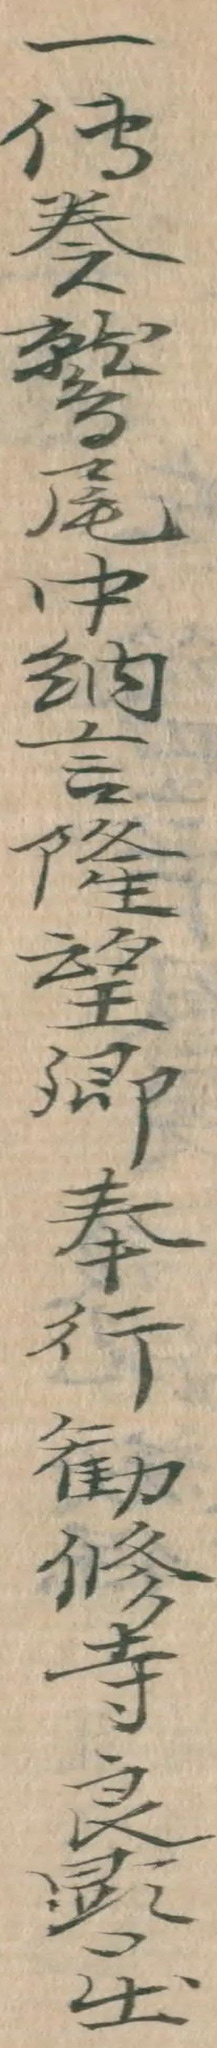一伝奏鷲尾中納言隆望卿奉行勧修寺良顕御出
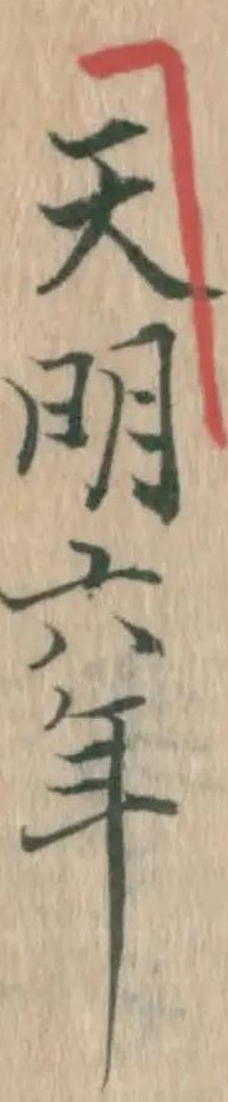天明六年
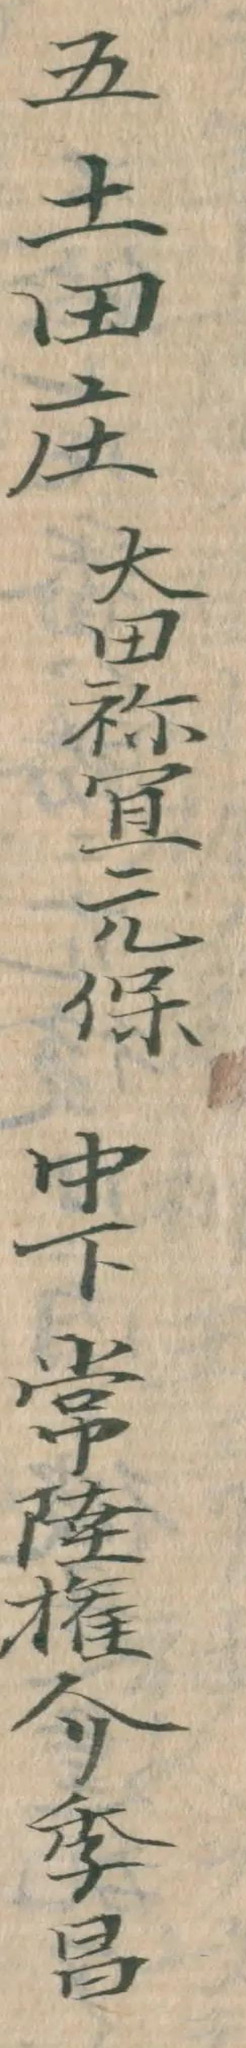五土田庄大田祢宜元保中下常陸権介季昌
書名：賀茂社記録. 第10冊
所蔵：国立国会図書館 National Diet Library, JAPAN
